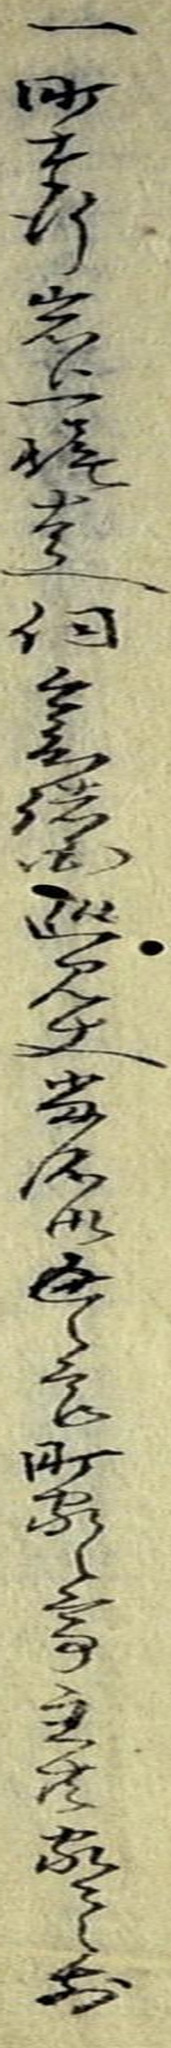一町奉行岩上梶大夫伺今度諸国巡見使当所御通之節町家之亭主共家々之前
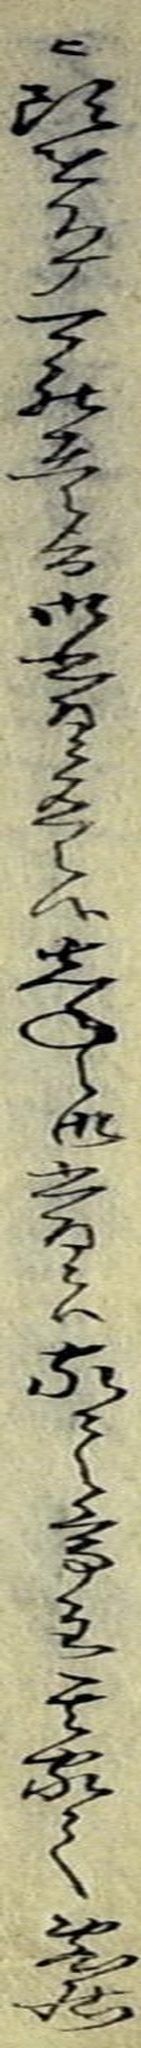ニ頭を下ケ可罷在之旨御書付ニ有之候先年之御書付ニハ家々之亭主其家之敷居
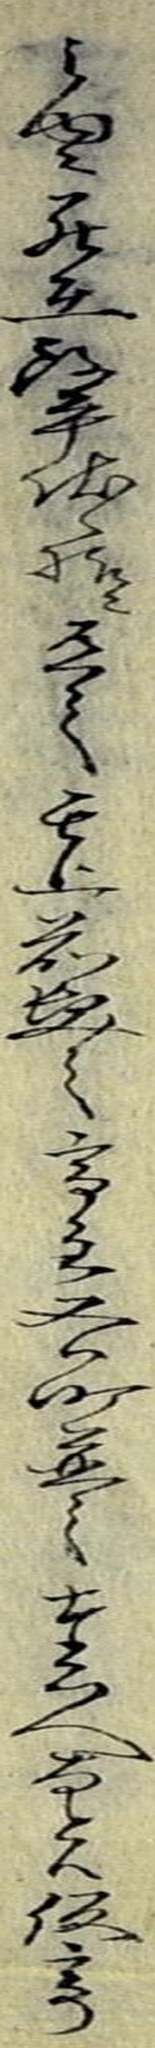之内ニ罷在致平伏候様ニ有之其上前髪之亭主又ハ町並之奉公人なとハ仮亭
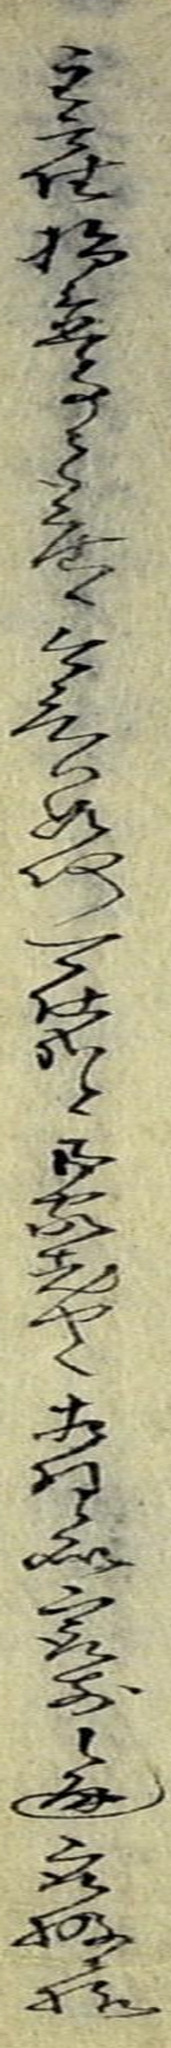主雇指置事ニ御座候今度ハ如何可仕哉と御家老中へ相伺候処最前之通取扱候様
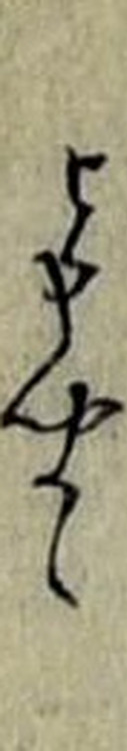被申聞候
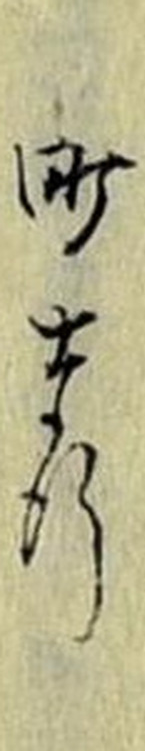町奉行
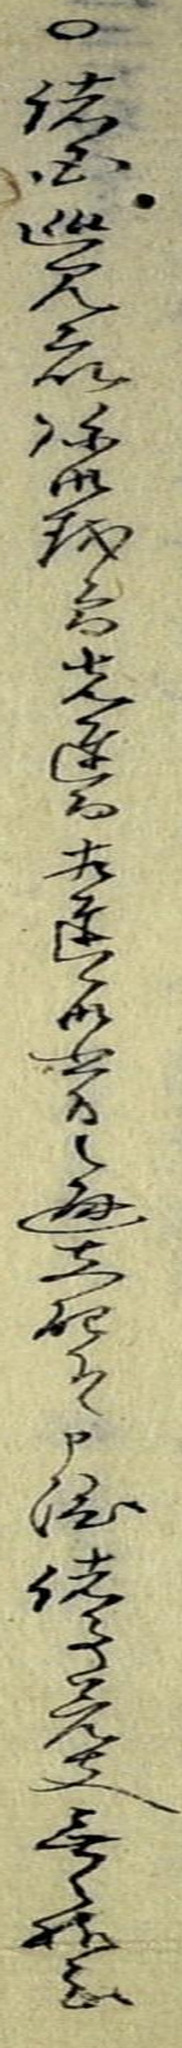〇諸国御巡見衆弥御越候間先達而相達候御書付之通支配下へ申渡諸事差支無之様念
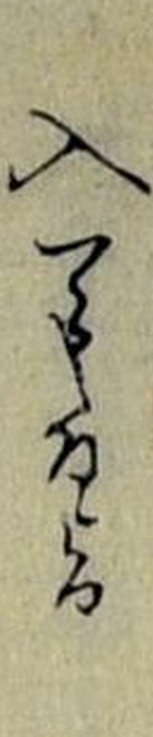入可申付旨
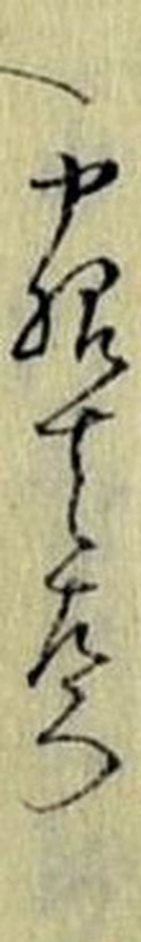中根十郎左衛門
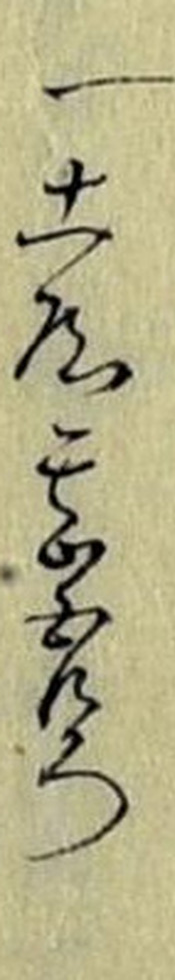土屋甚五左衛門
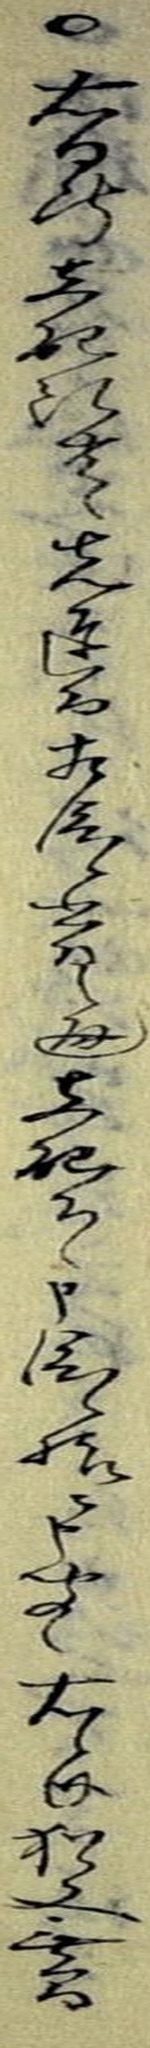〇右同断支配頭共へ先達而相渡候書付之通支配下へ申渡候様ニ申聞候右之趣猶又無間
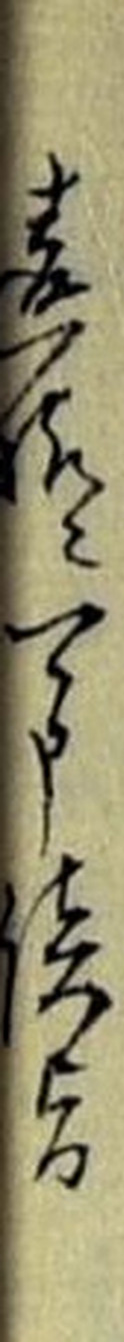違様ニ可申談旨
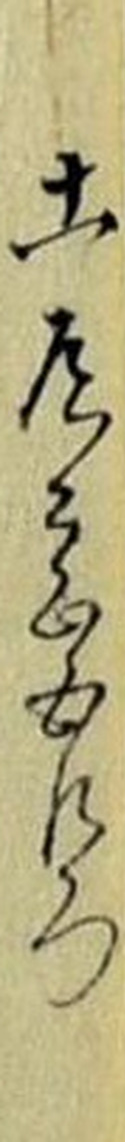土屋甚五左衛門
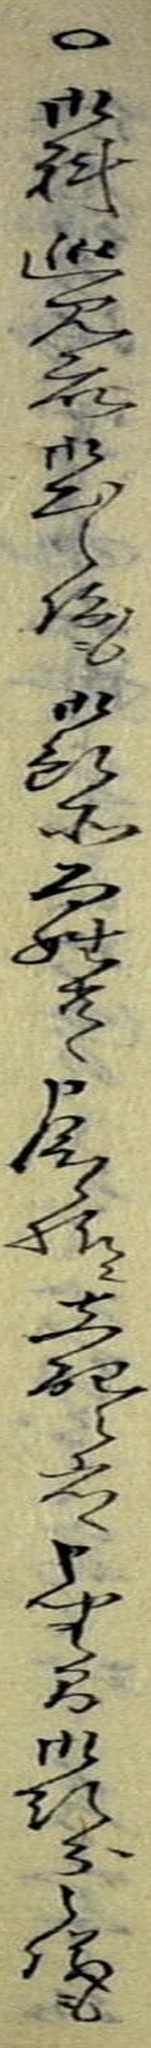〇御料巡見衆御出之儀も御預所百姓共へ申渡候様ニ支配之者へ申聞候間御領分之儀も
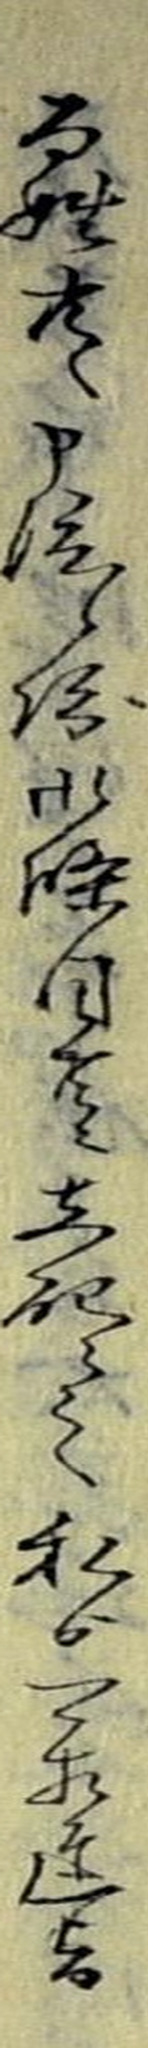百姓共へ申渡候儀御条目共ニ支配々々へ私ゟ可相達旨
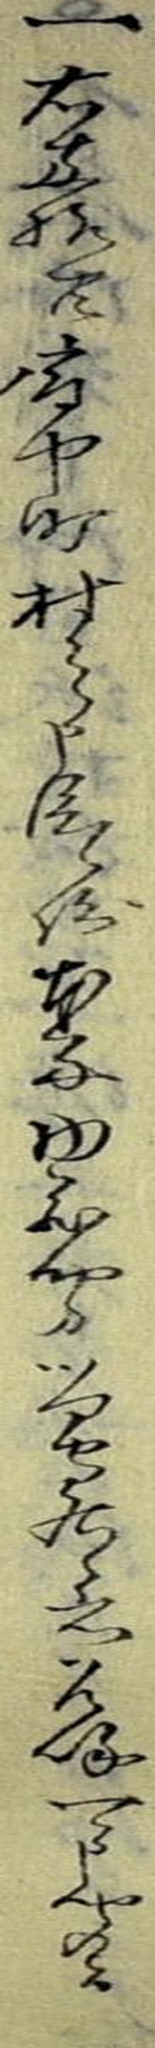一右両様共府中町村々へ申渡候儀本多内蔵助方留守居之者召呼可申聞旨
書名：命令之部 一
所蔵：福井県文書館 Fukui Prefectural Archives
